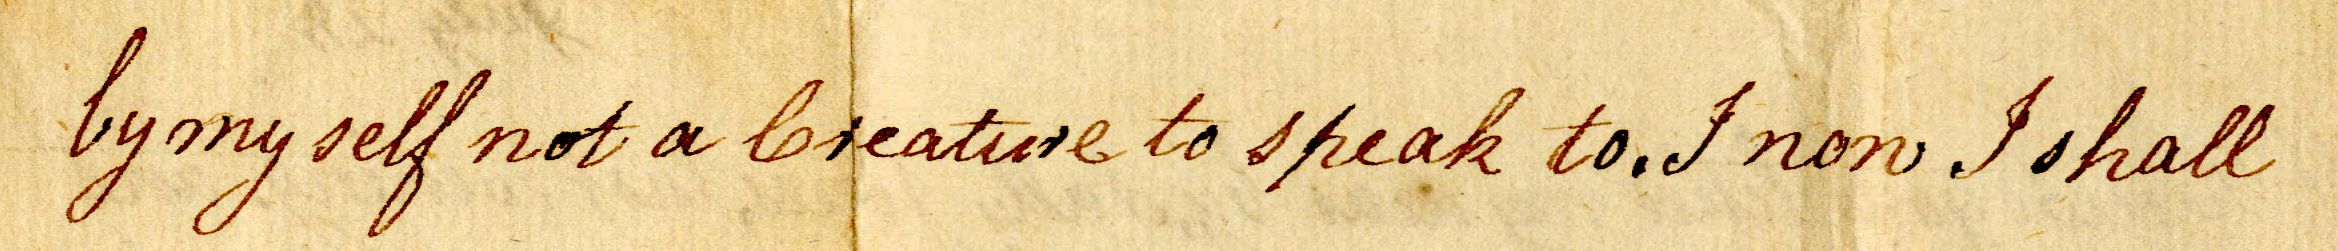by my self not a Creature to speak to, I now I shall
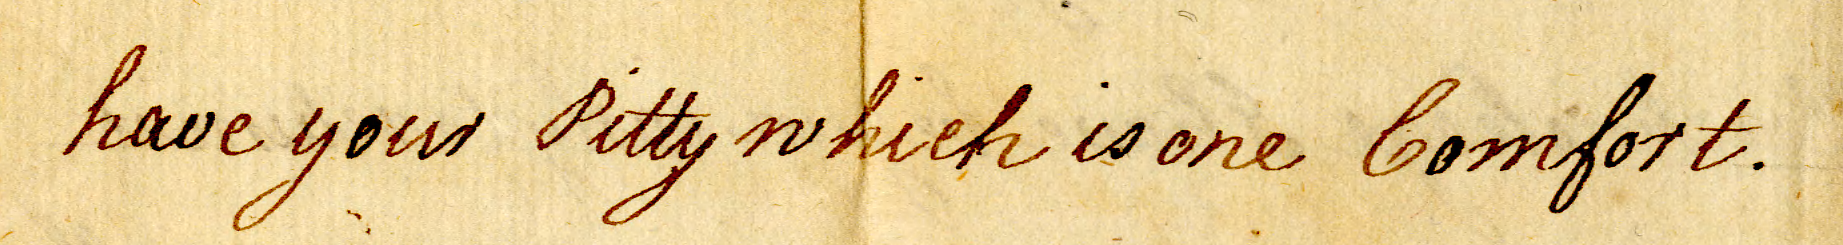have your Pitty which is one Comfort.
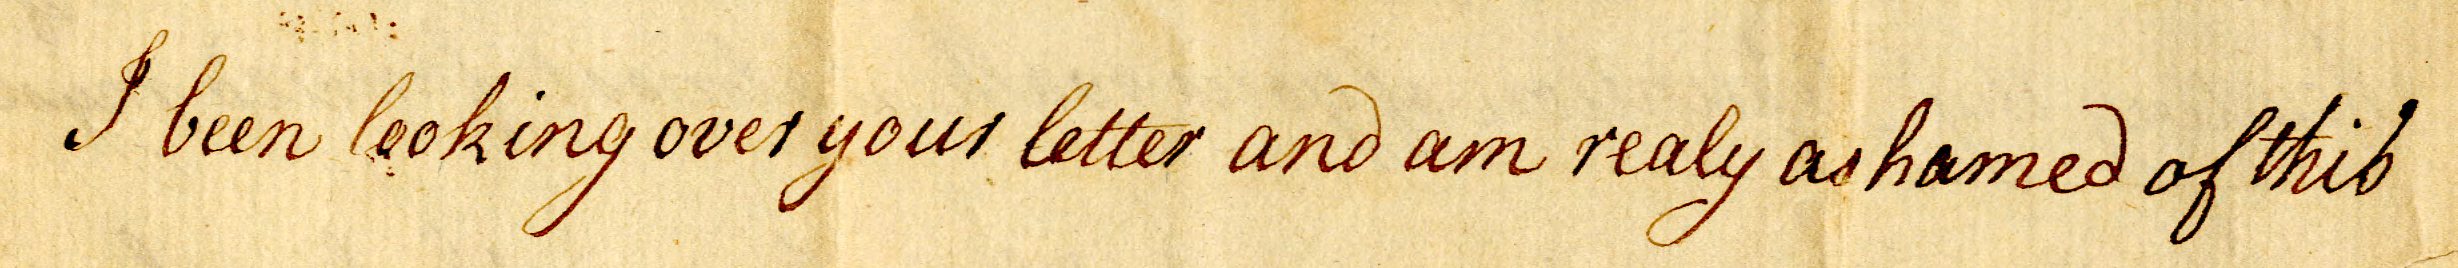I been looking over your letter and am realy ashamed of this
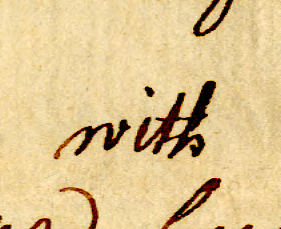with
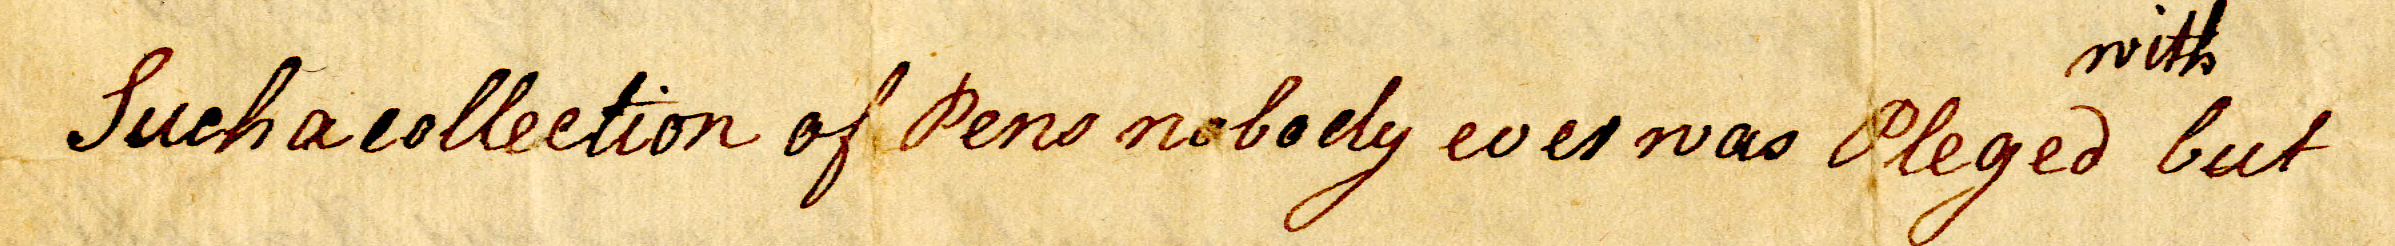Such a collection of Pens nobody ever was Pleged but
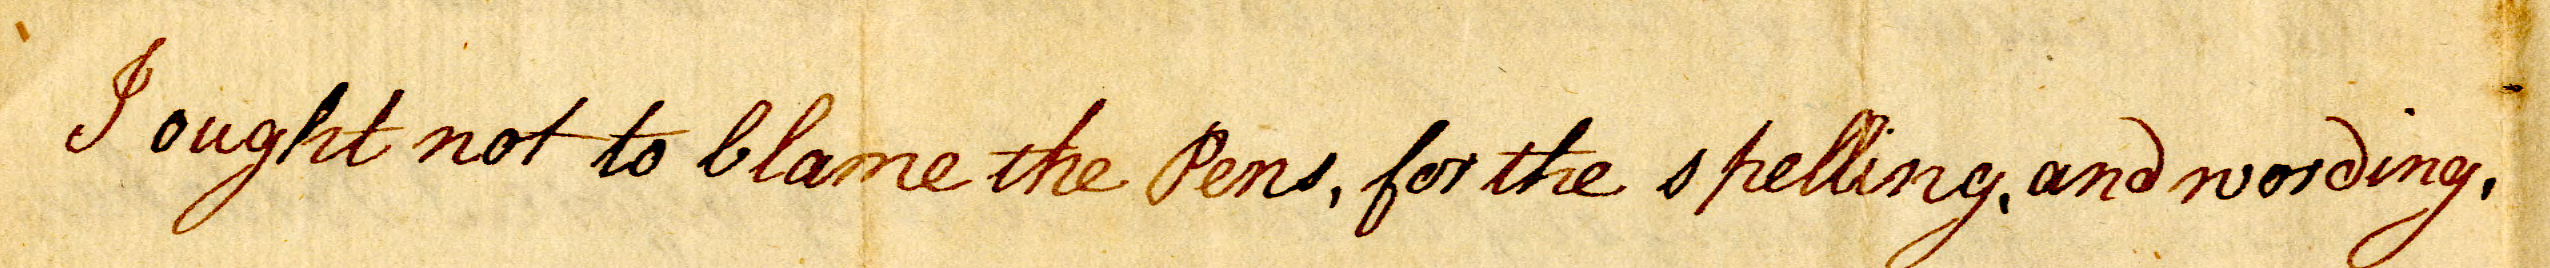I ought not to blame the Pens, for the spelling, and wording,
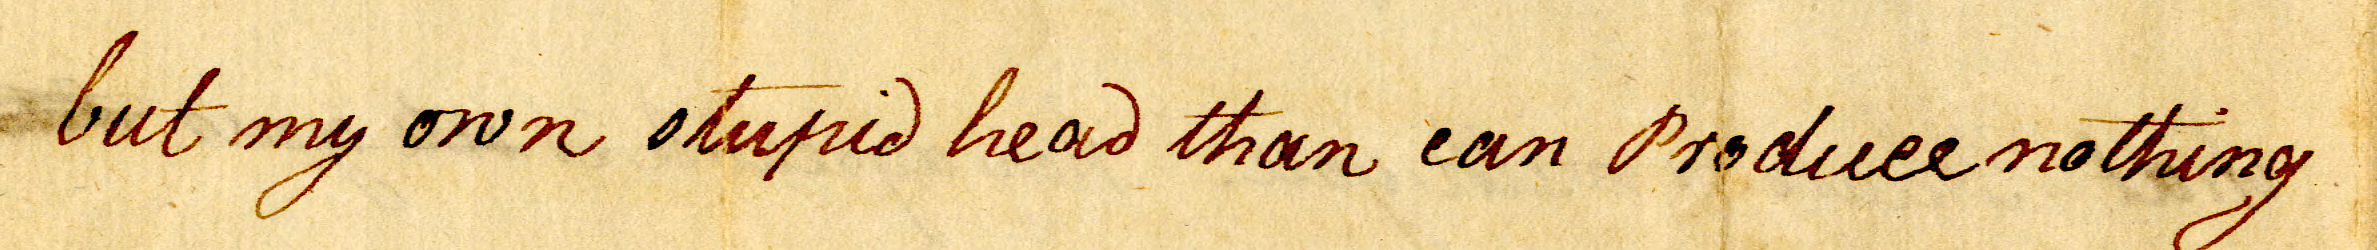but my own stupid head than can Produce nothing
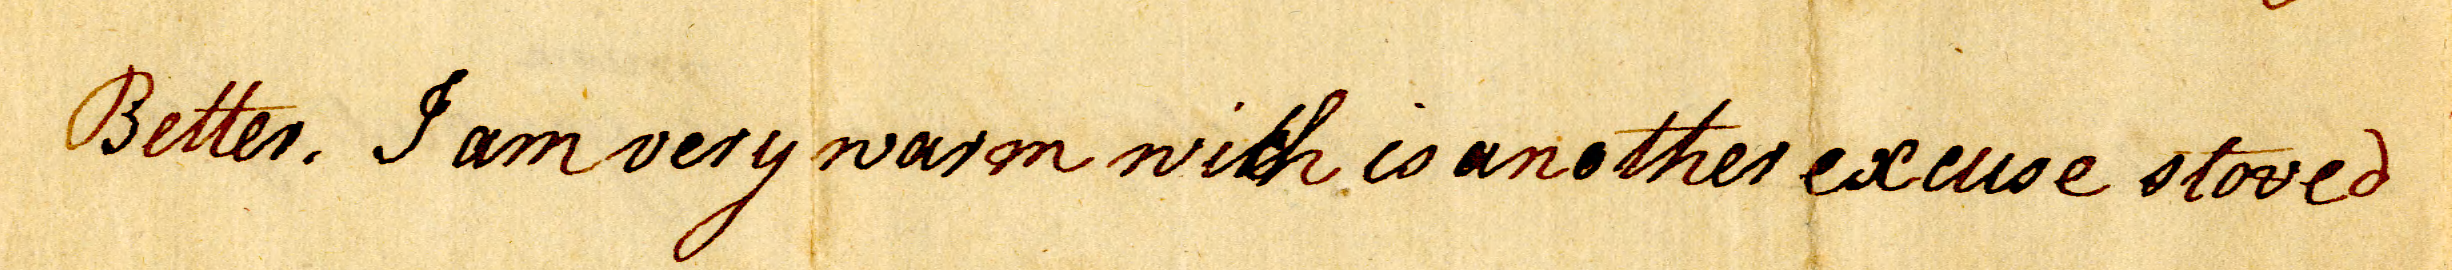Better. I am very warm wich is another excuse stoved
